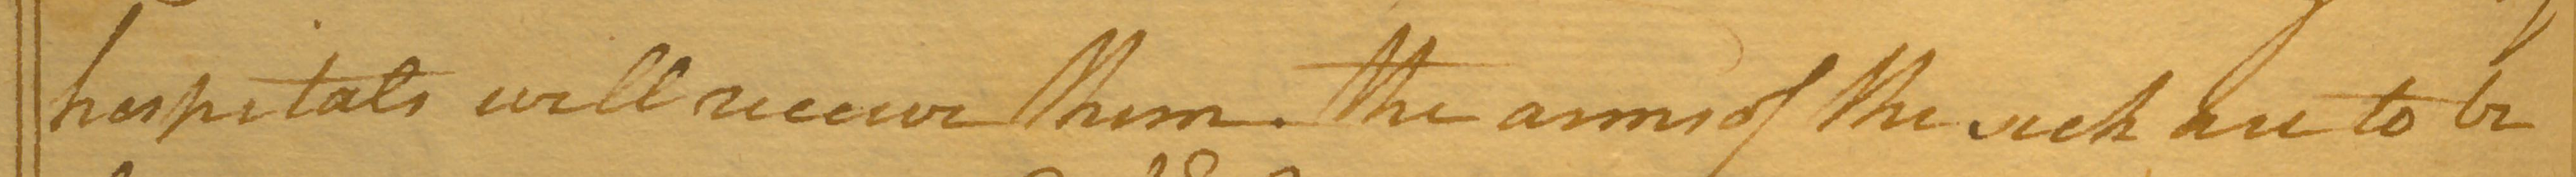hospitals will receive them. the arms of the sick are to be
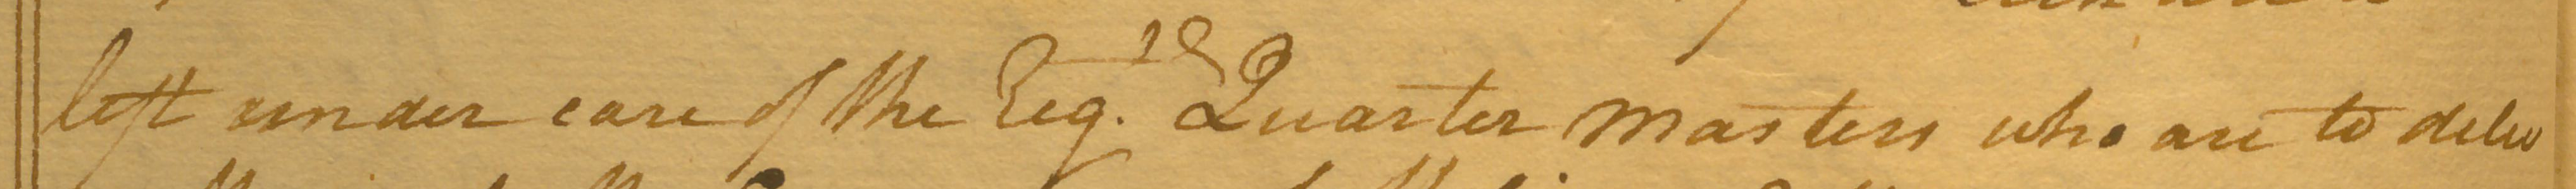left under care of the Reg^tl. Quarter masters who are to deliv
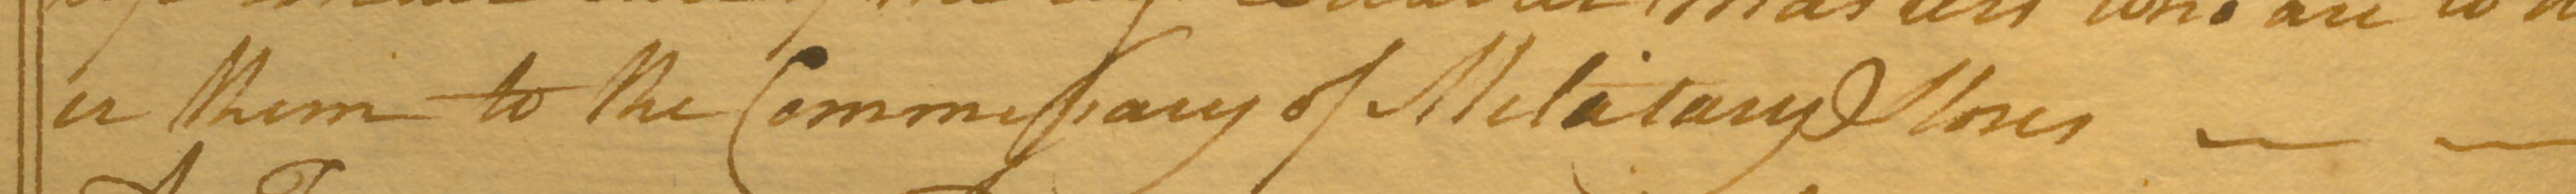er them to the Commissary of Military Stores- -
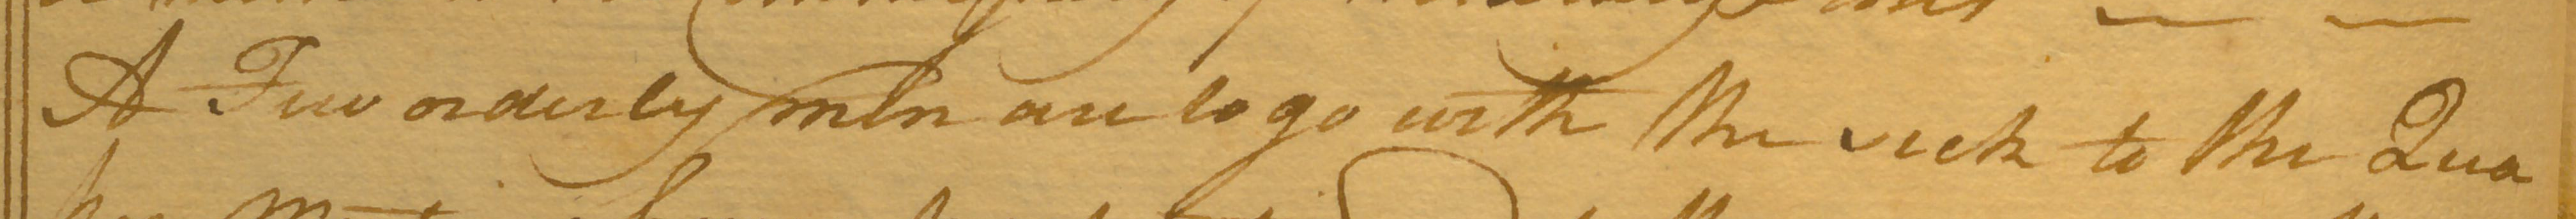A Few orderly men are to go with the sick to the Qua
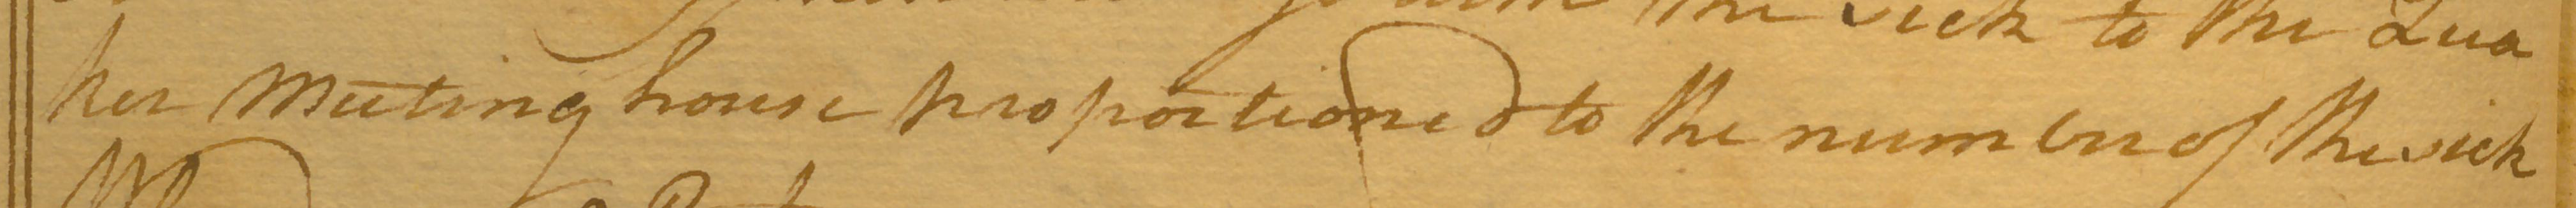ker meeting house proportioned to the number of the sick
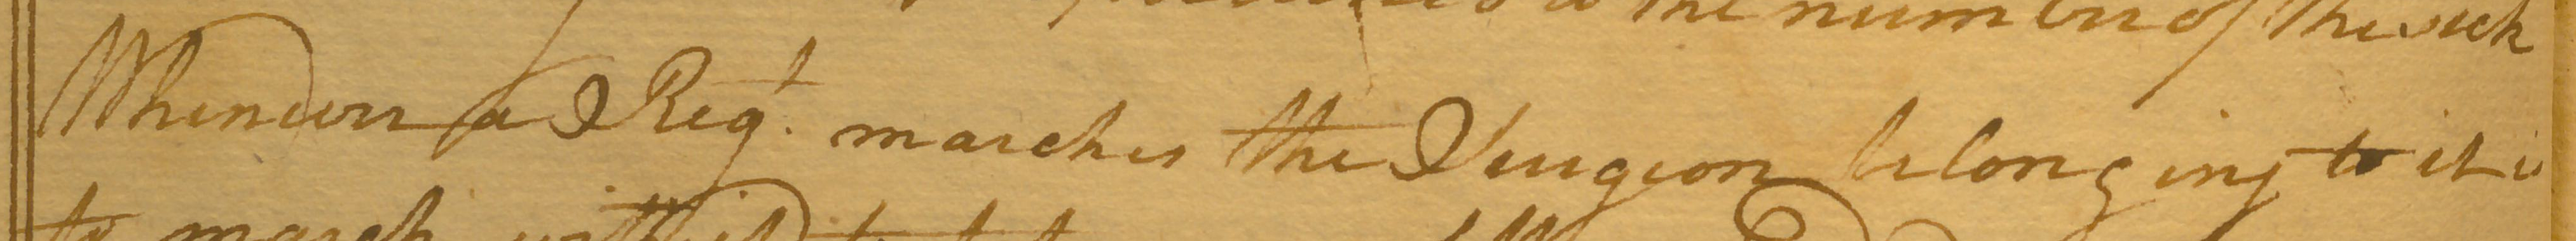Whenever a Reg^t. marches the Surgeon belonging to it is
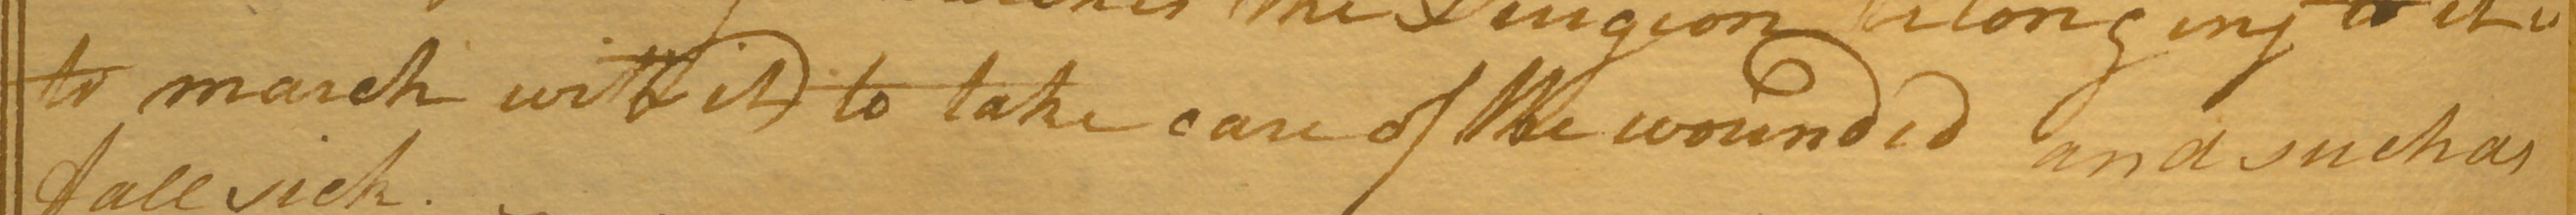to march with it to take care of the wounded and such as
